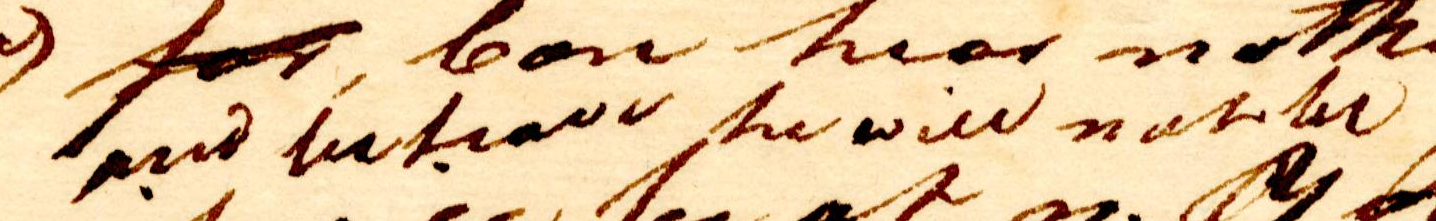and instead he will not be
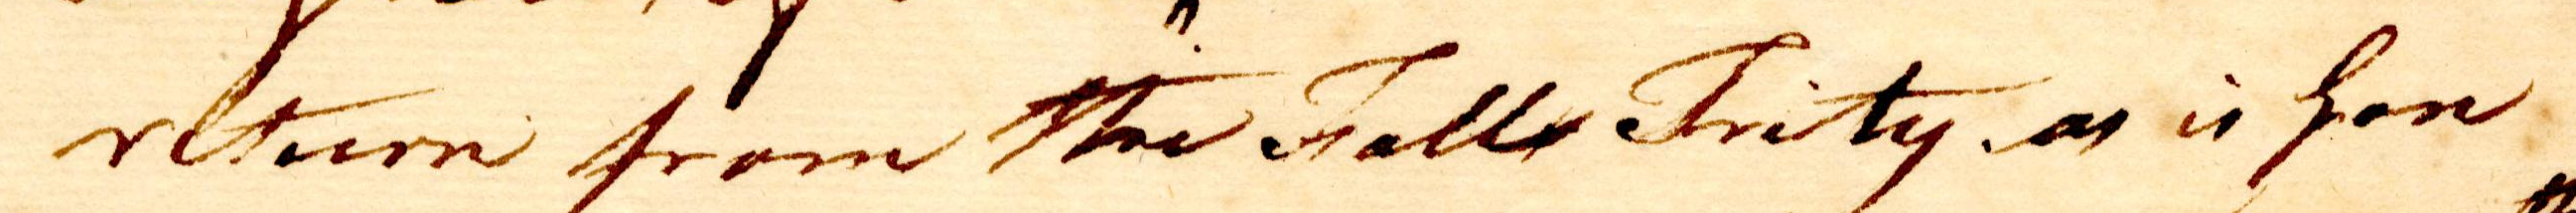return from the Falls Trity as is gon
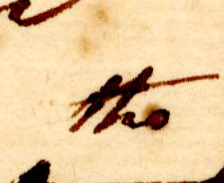tho
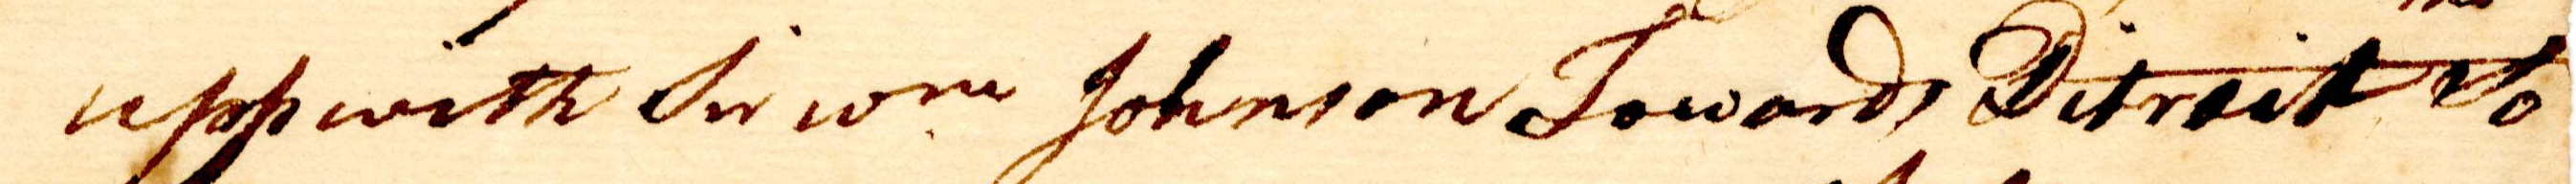upp with Sir W^m Johnson Towards District to
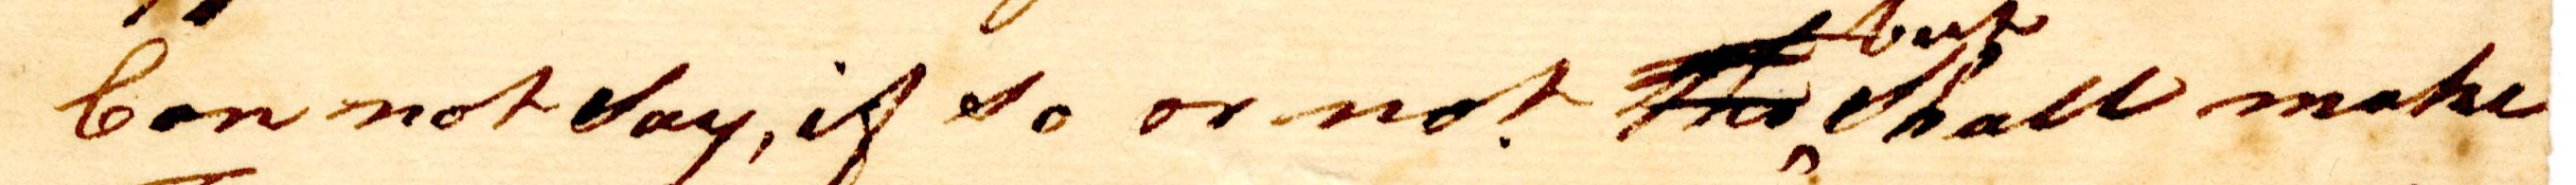Can not say, if so or not [tho] ^ shall make
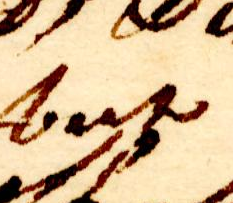but
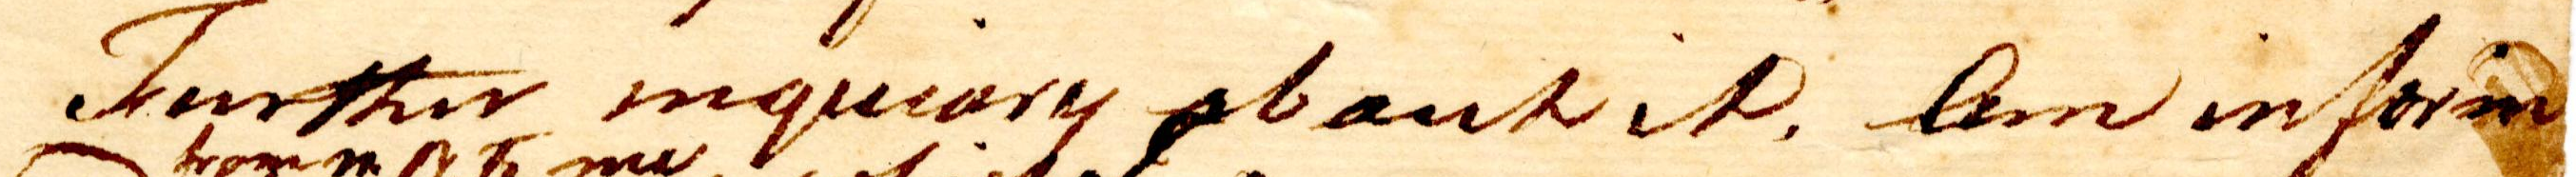Further inquiry about it. Can inform
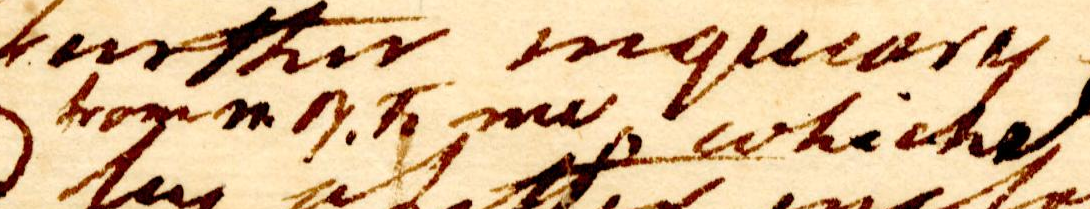from N Y to me which
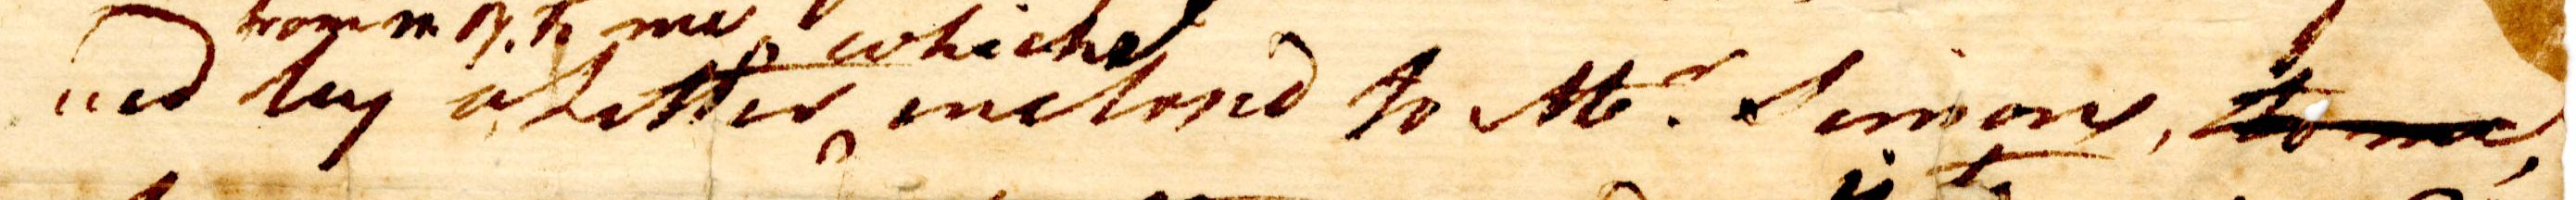med by a Letter ^ inclosed to M^r Simons, [to me]
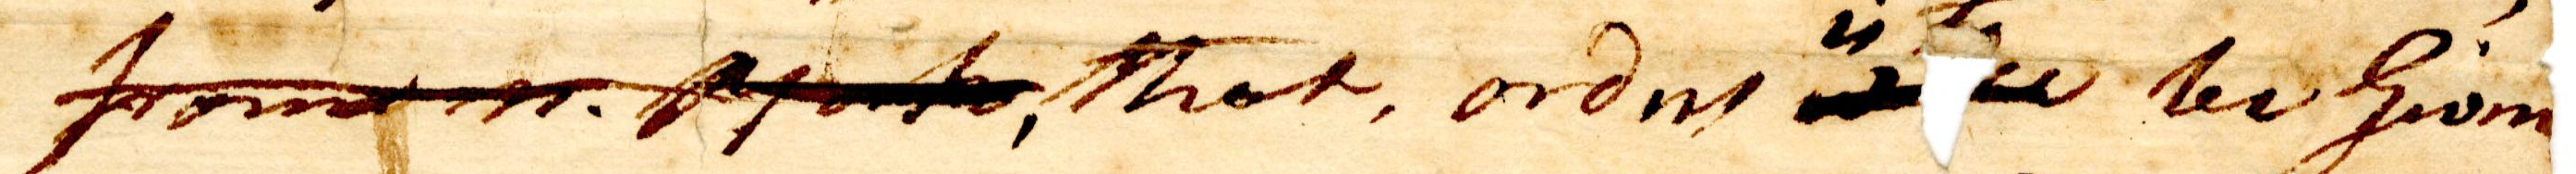[from M. ______] that ordesr [will] be given
